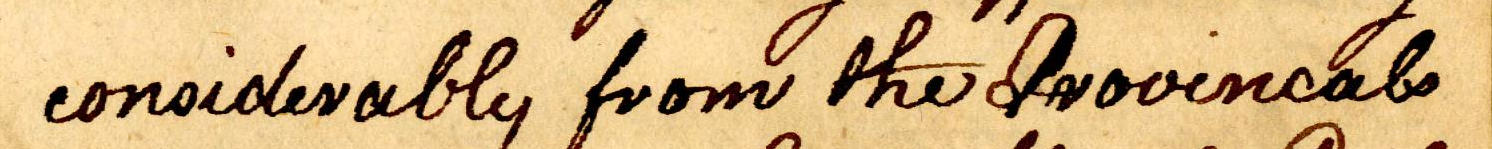considerably from the Provincals
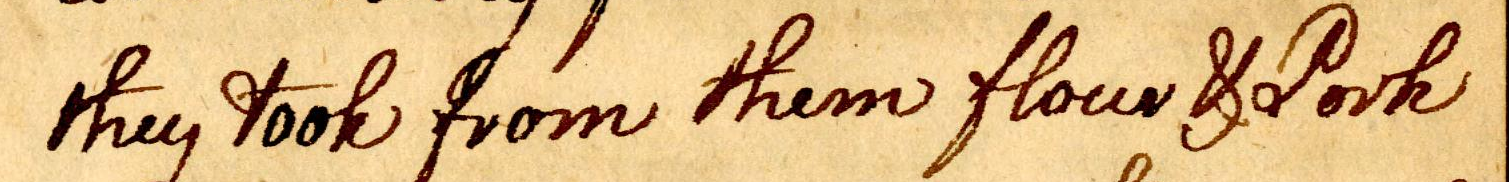they took from them flour & Pork
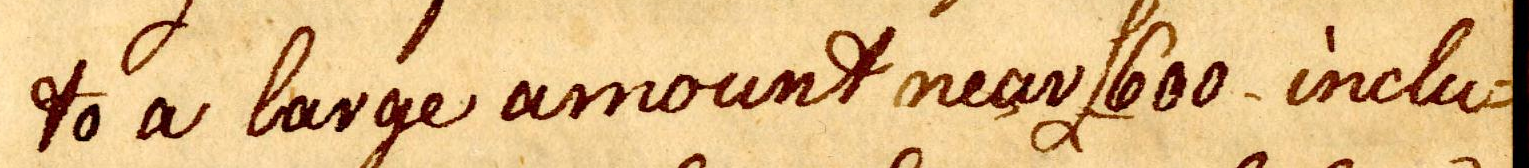to a large amount near £600 inclu-
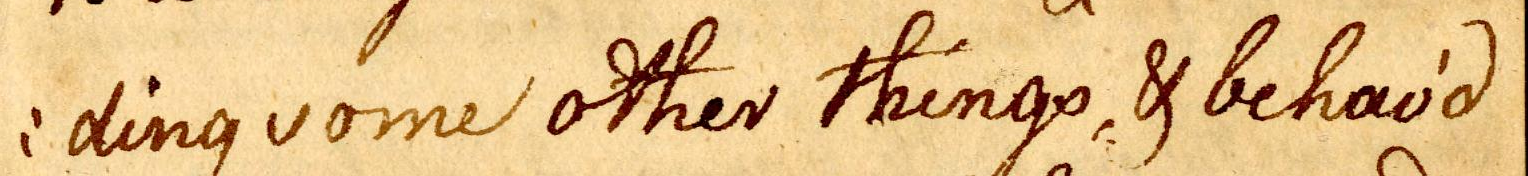-ding some other things & behav'd
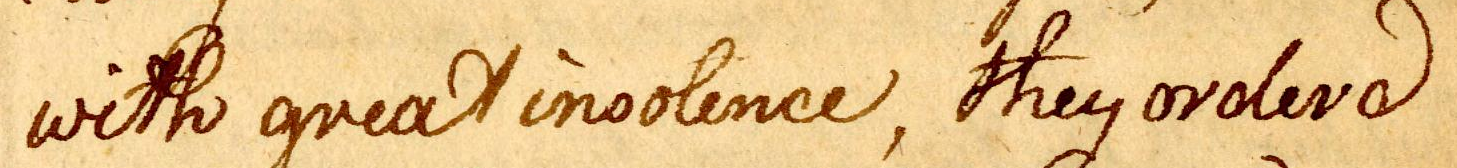with great insolence, they orderd
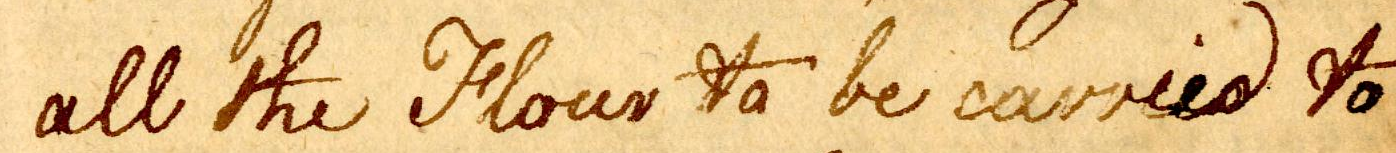all the Flour to be carried to
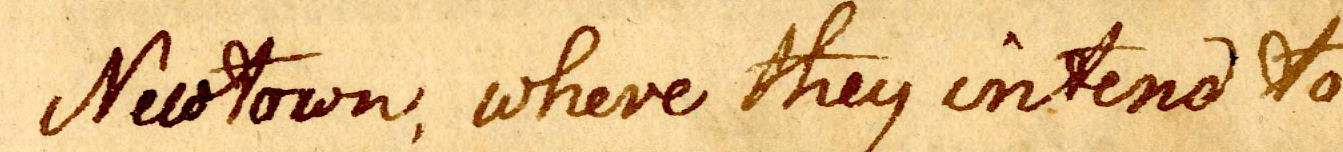Newtown, where they intend to
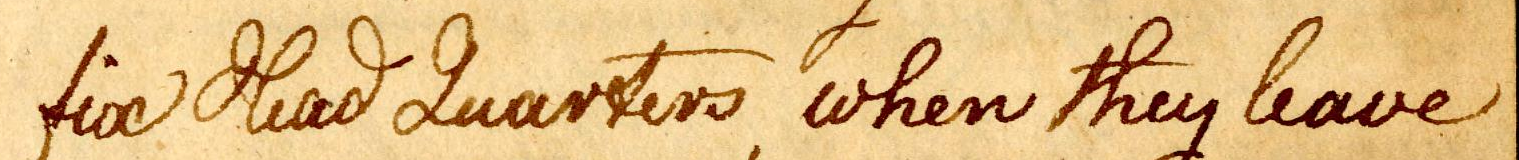fix Head Quarters, when they leave
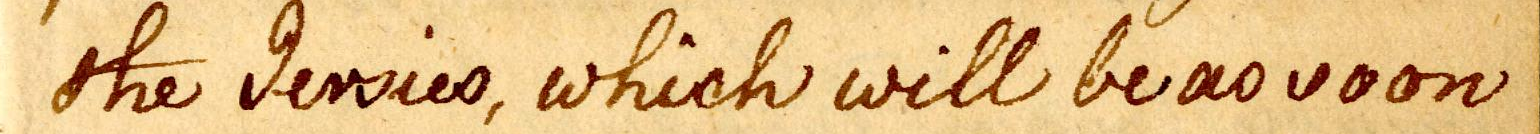the Jersies, which will be as soon
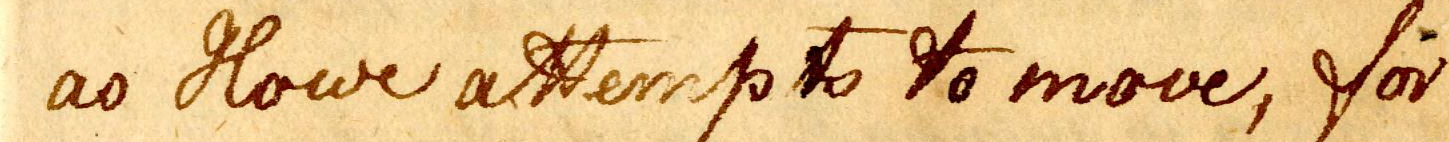as Howe attempts to move, for
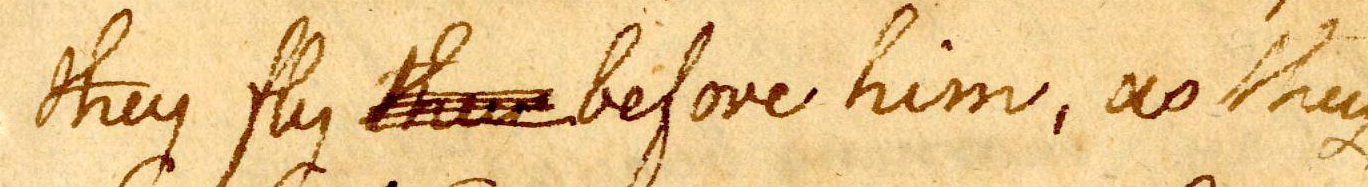they fly [their] before him, as they
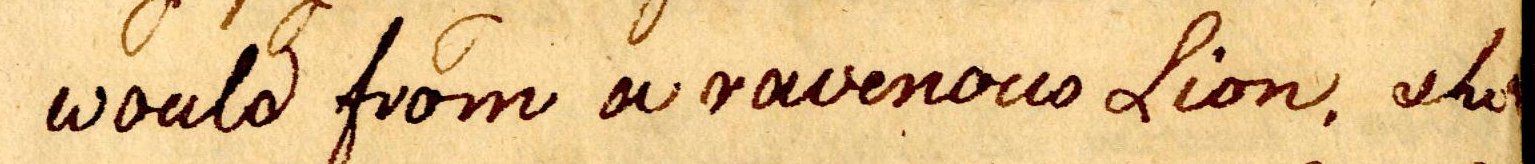would from a ravenous Lion, she
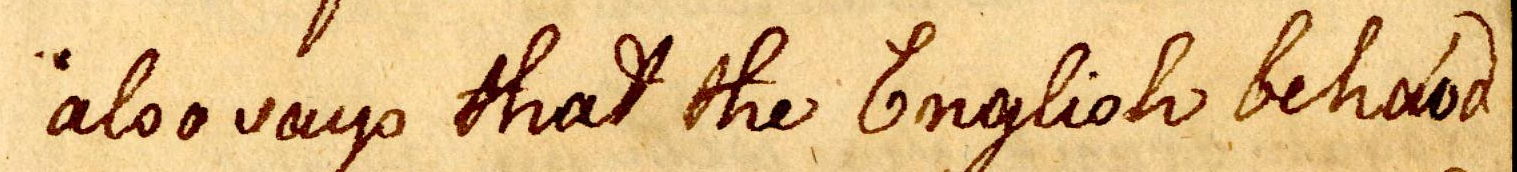also says that the English behav'd
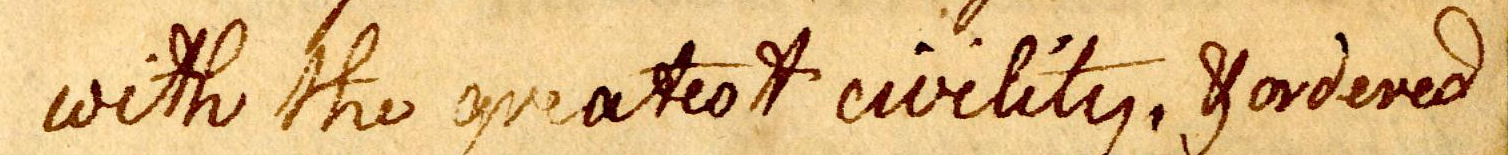with the greatest civility, & ordered
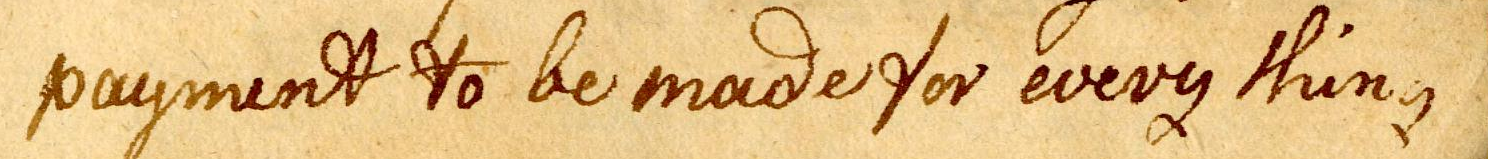payment to be made for every thing
